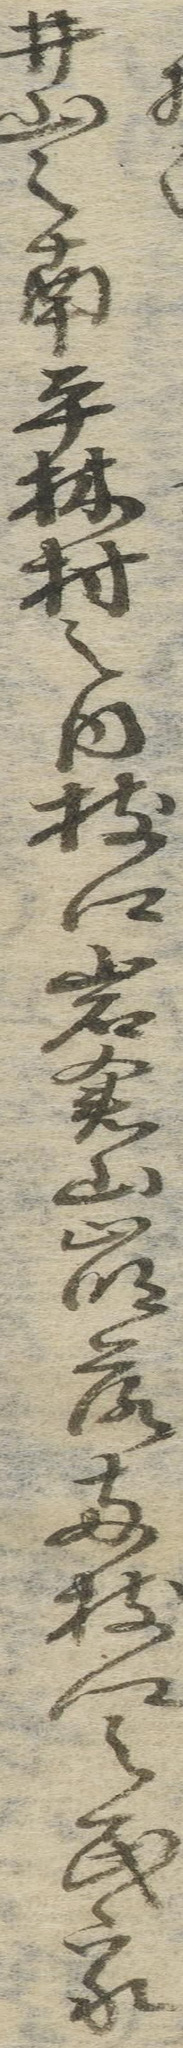井山之南平林村之内枝郷岩倉山崩落両枝郷之民家
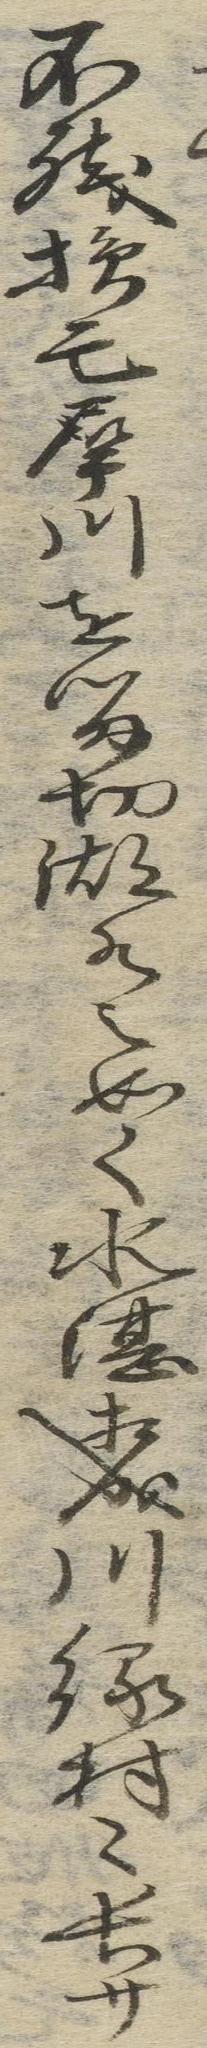不残損亡犀川を留切湖水之如く水湛相成川縁村同々長サ

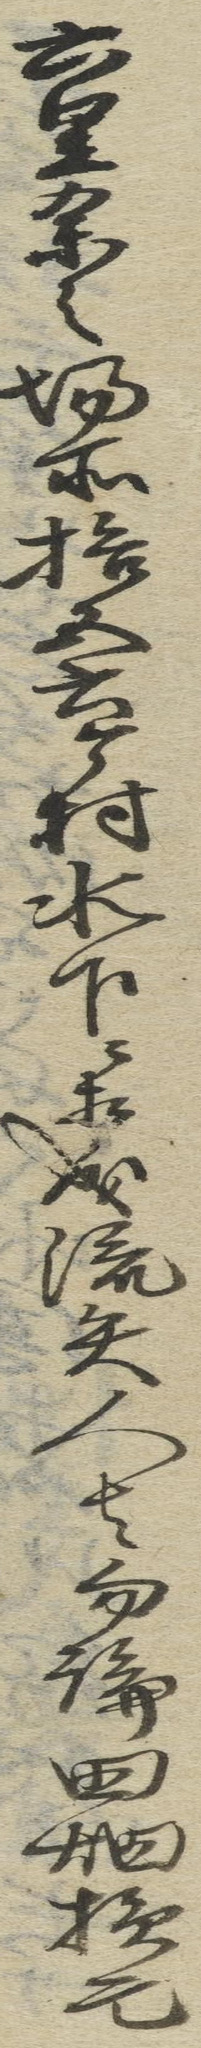六里余之場所拾五六ヶ村水下二相成流失人は勿論田畑損亡
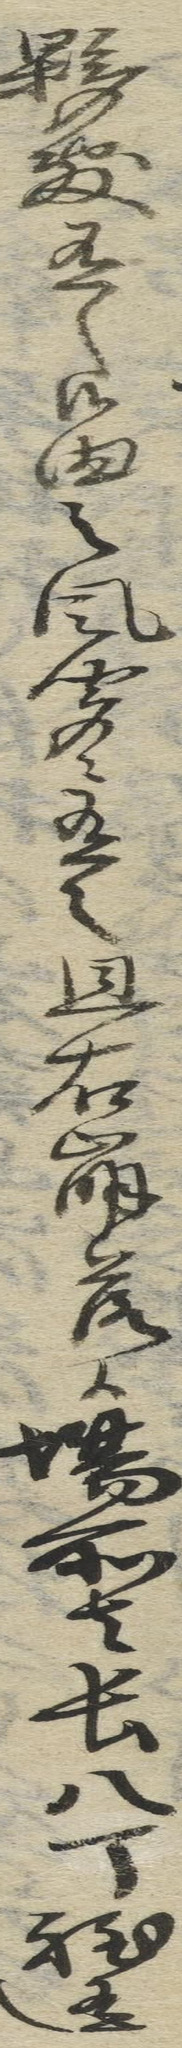夥敷有之候由之風聞二有之且右崩落候場所は長八丁程有之
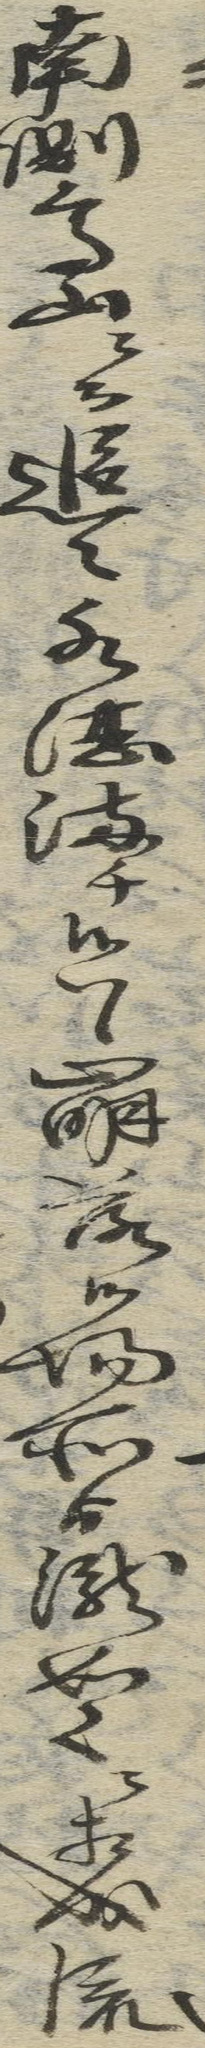南側高山二而追々水湛満チ候ハゝ崩落候場所ゟ瀧如く二相成流
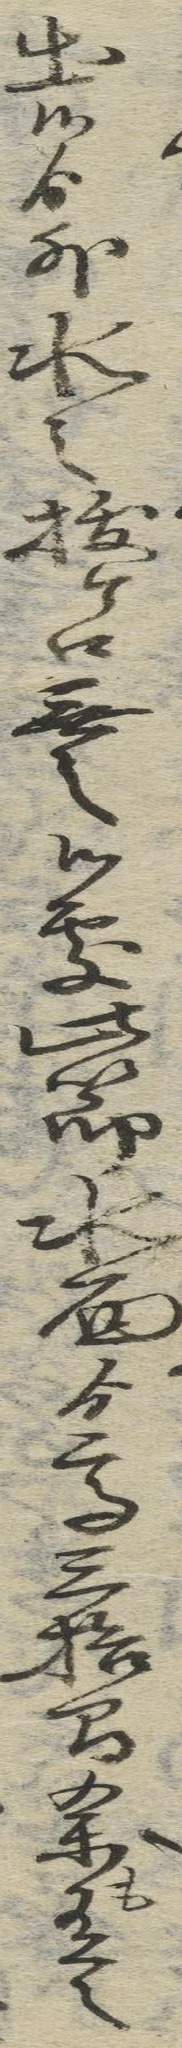出候ゟ外水之抜ヶ口無之候処此節水面ゟ高三拾間余も有之
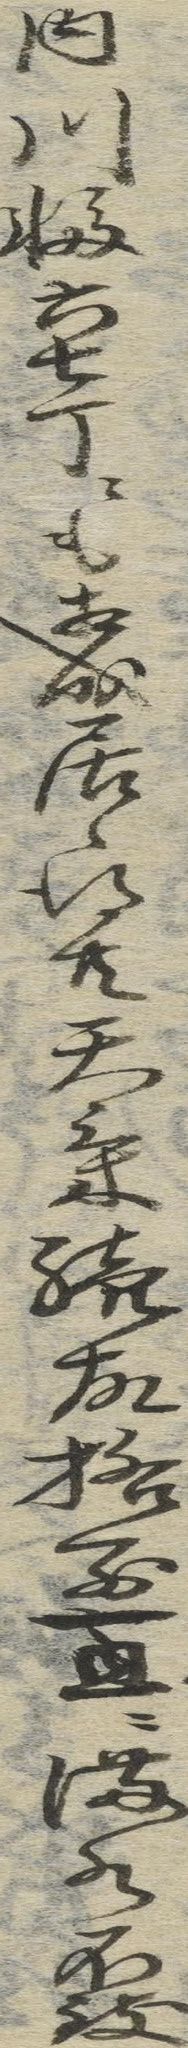内川幅六七丁二も相成居候得共天気続故格別一日二満水不致
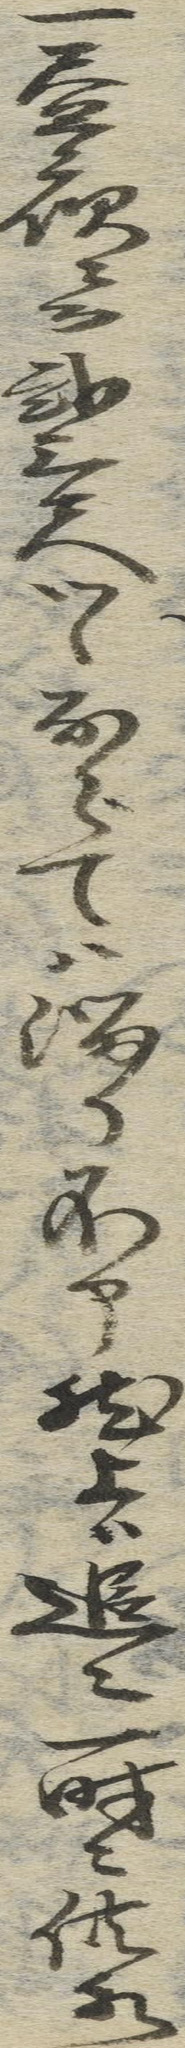一昼夜二而弐三尺ツゝならてハ溜り不申然上ハ追々一時二洪水
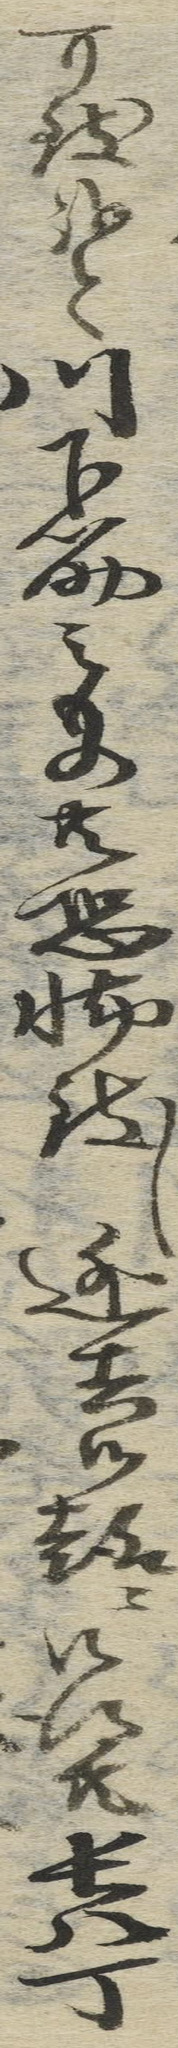可致哉と川下筋之もの共恐怖致し逃去候趣二候得共長八丁
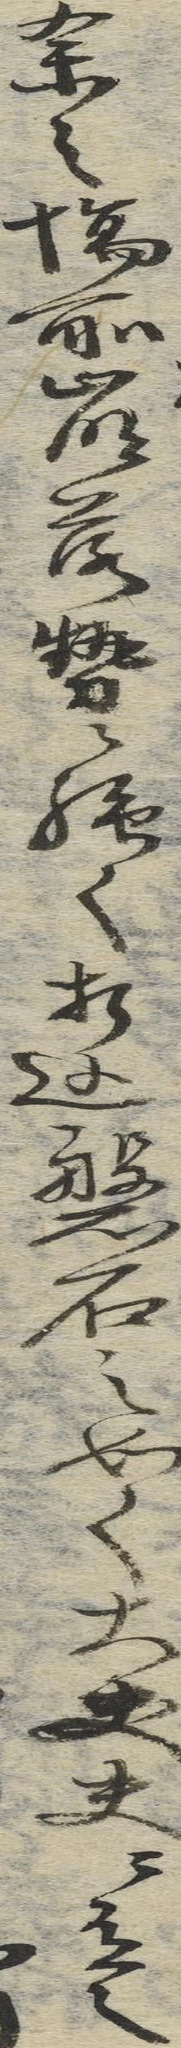余之場所崩落勢二強く打込磐石之如く大丈夫二有之
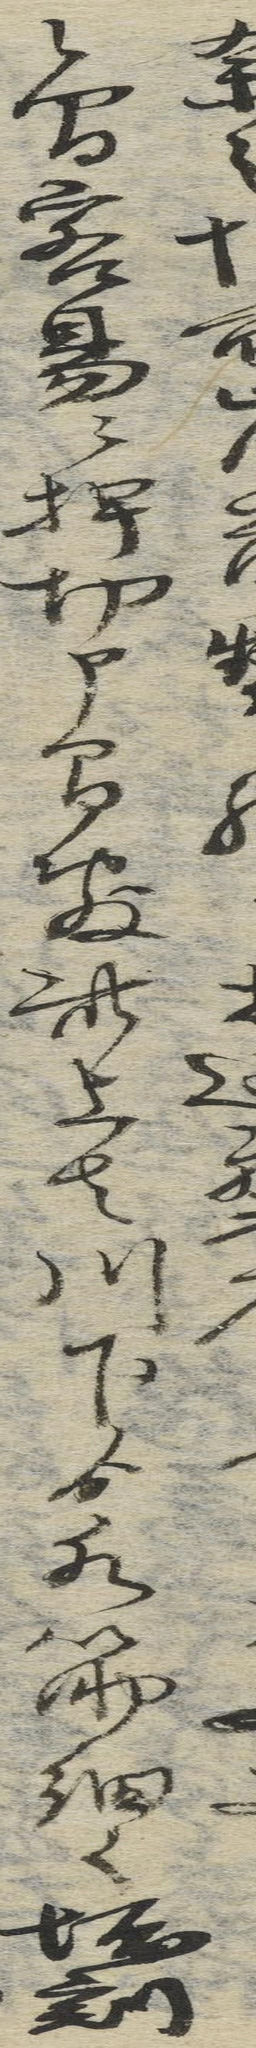候間容易二押切申間敷此上は川下ゟ水筋細く掘割
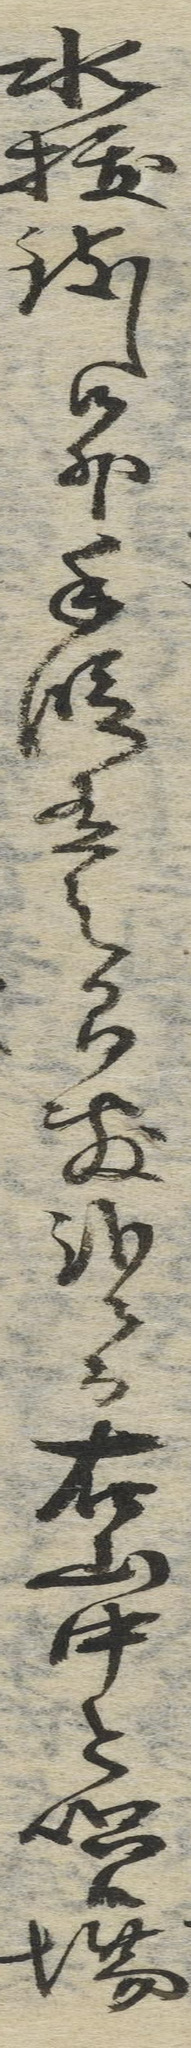水抜致候哉手段有之間敷哉二而右山中と唱候場
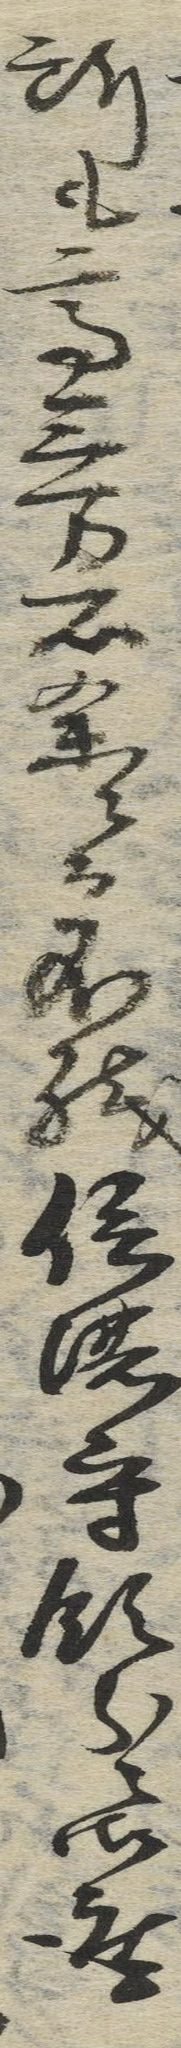所も高三万石余二而不残信濃守領分二御座候
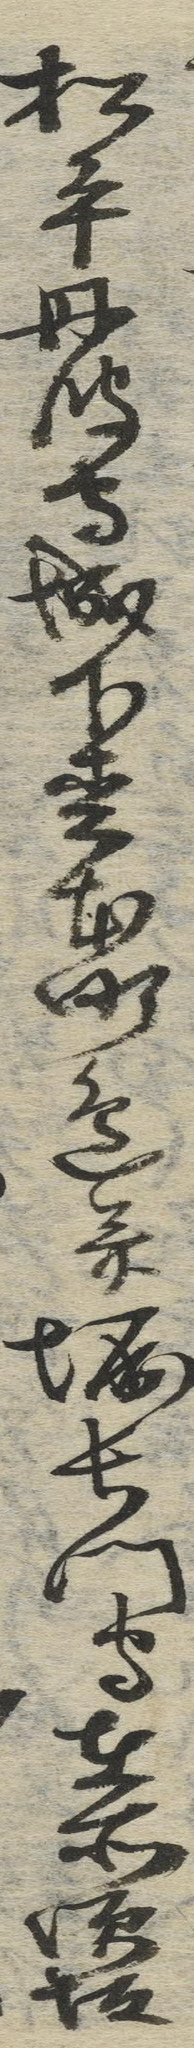一松平丹波守城下枩本町辺并堀長門守在所須坂
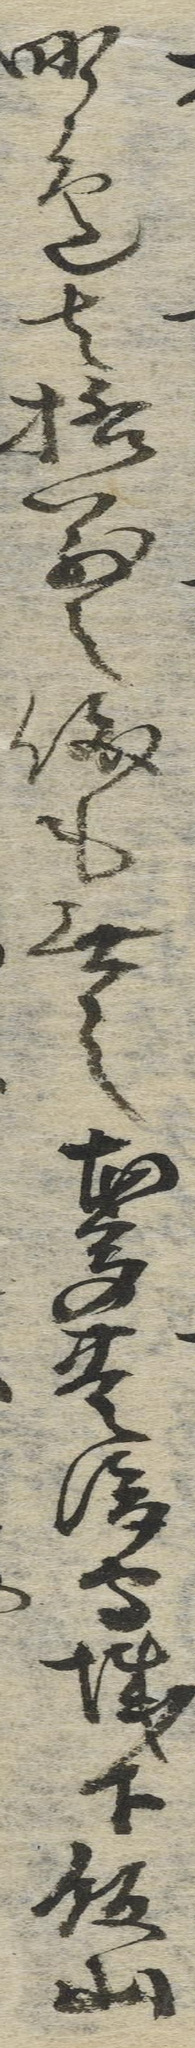町辺は損いたし儀も無之本多豊後守城下飯山
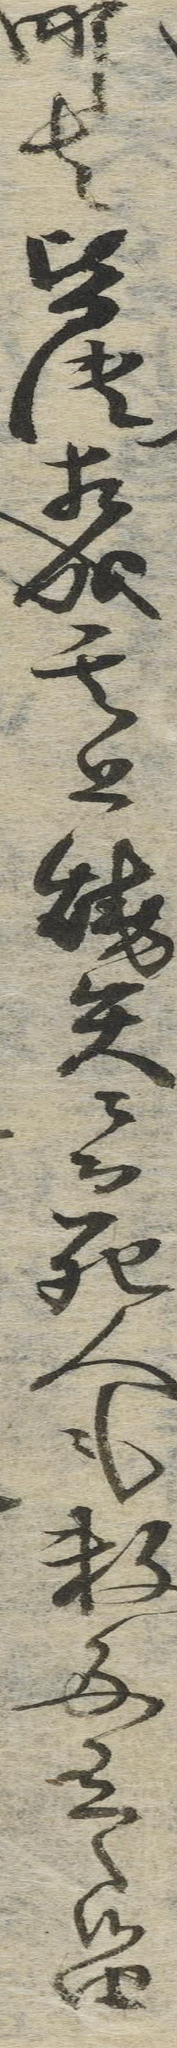町は皆潰相成其上焼失二而死人も数多有之候由
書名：信濃越後　地震書留
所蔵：東京大学地震研究所図書室 Earthquake Research Institute Library, The University of Tokyo, JAPAN
